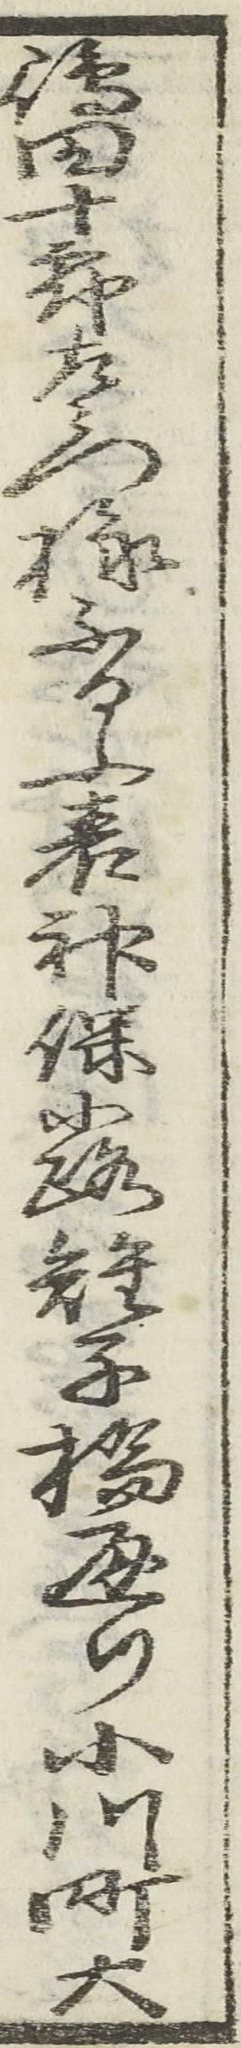嶋田十郎左衛門様ふるふ表神保小路雉子橋通り小川町大
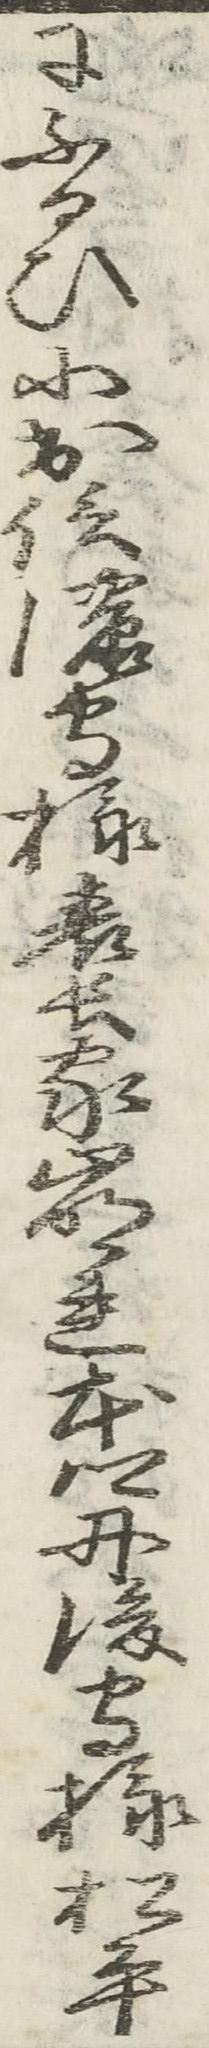にふるひ小出信濃守様表長家崩れ本郷丹後守様松平
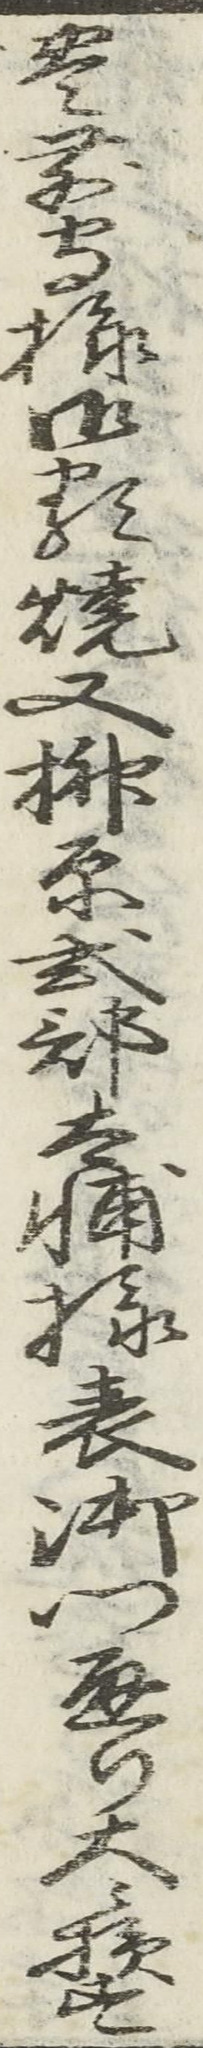豊前守様御類焼又柳原式部大輔様表御門通り大ニ損す
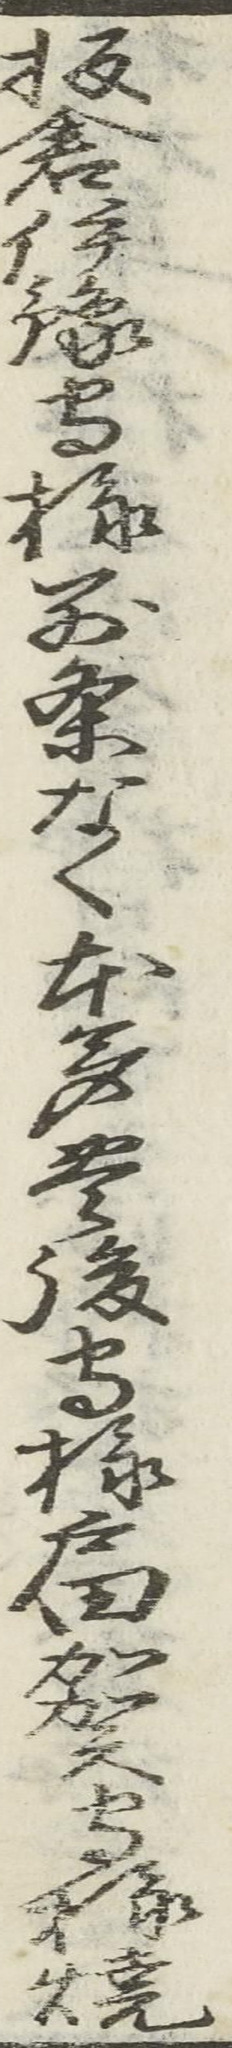板倉伊豫守様別条なく本多豊後守様戸田加賀守様焼
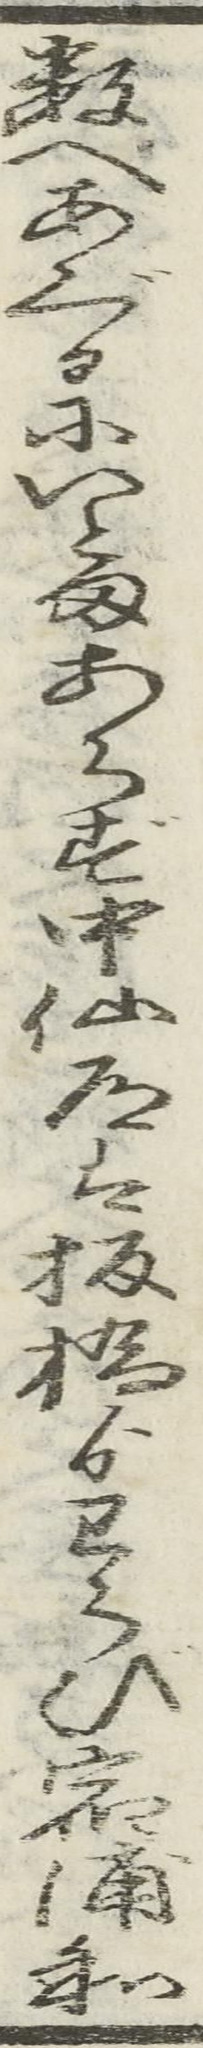数へあぐるにいとまあらす中仙道は板橋ゟわらひ宿浦和
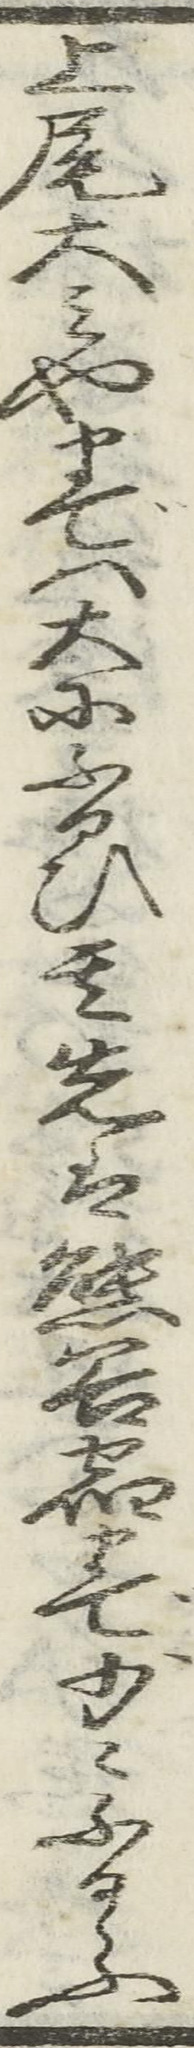上尾大みやまでは大にふるひ其先は熊谷宿まで少〻ふるふ
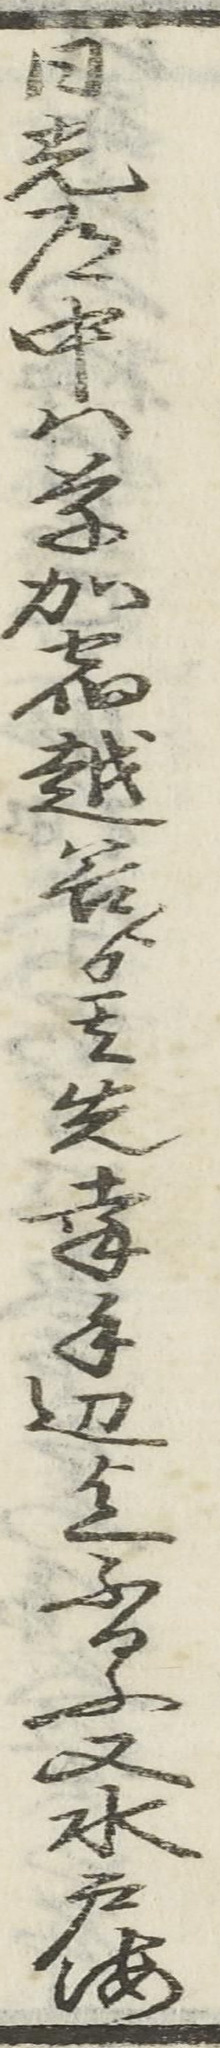日光道中は草加宿越谷ゟ其先幸手辺迄ふるふ又水戸海
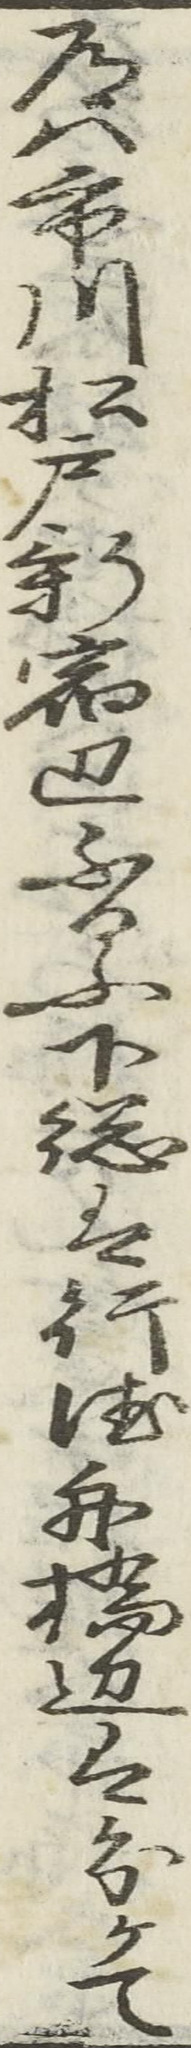道は市川松戸新宿辺ふるふ下総は行徳舟橋辺は分ケて
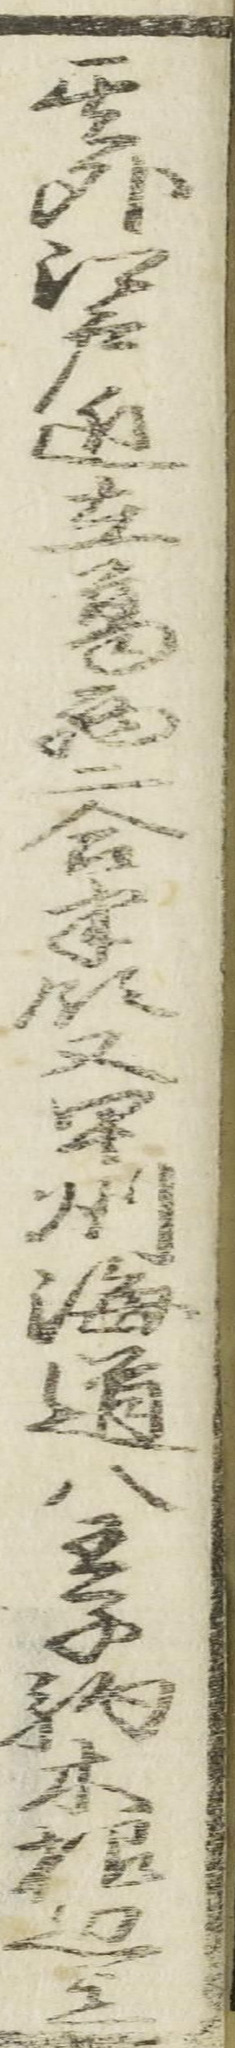其外江戸近在葛西ニ合半領又甲州海道八王子駒木根辺迄
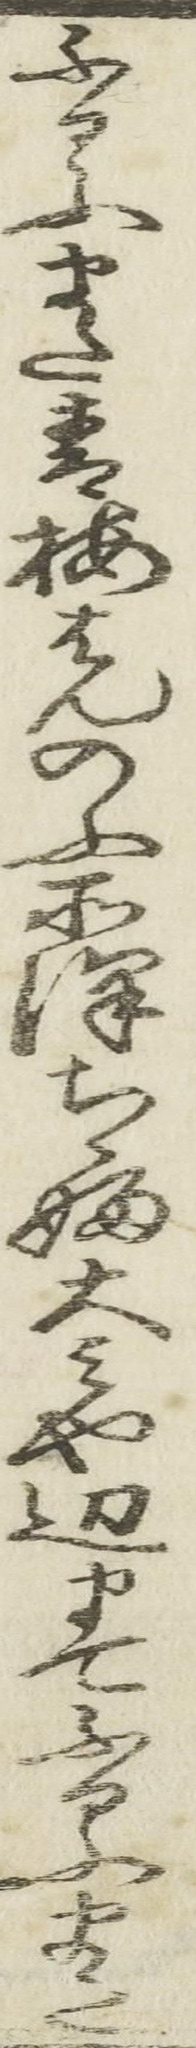ふるふまた青梅はんのふ所沢ちゝふ大みや辺まてふるふまた
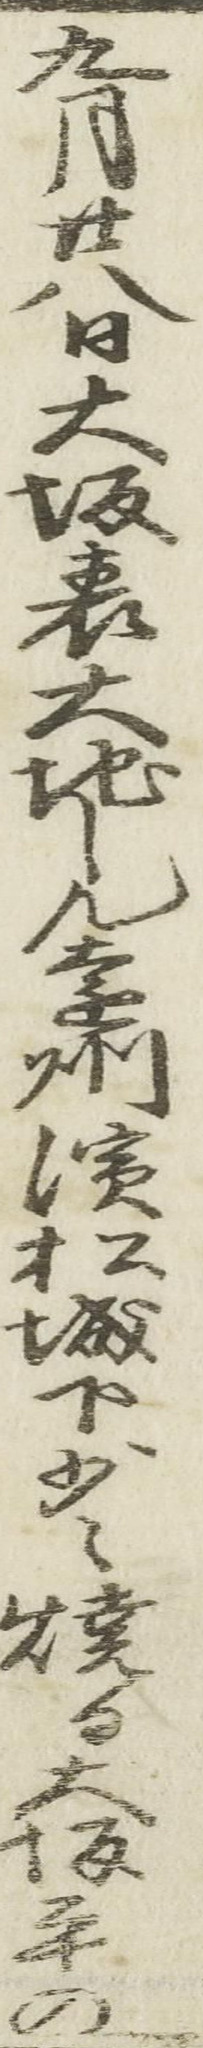九月廿八日大坂表大地しん遠州浜松城下少〻焼る大坂平の
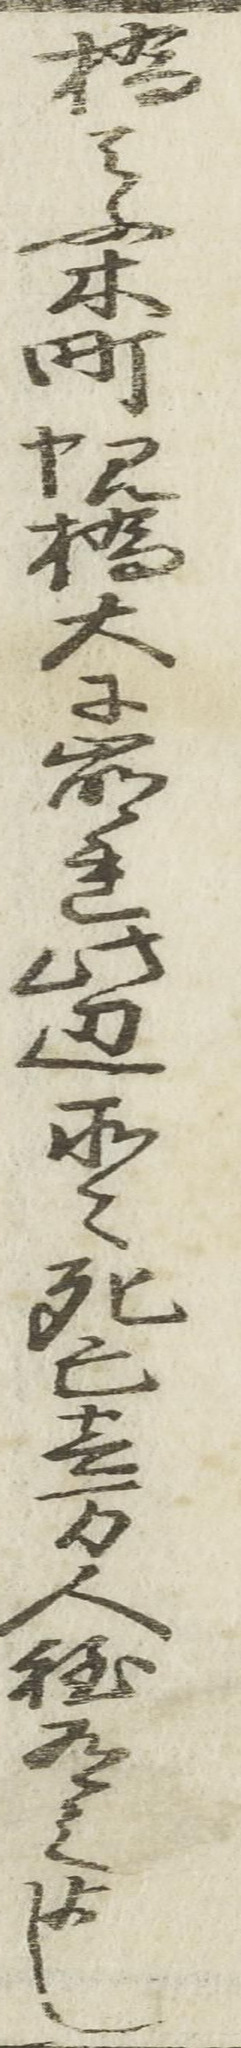橋そふ木町恨橋大に崩れ此辺所〻死亡壱万人程有之よし
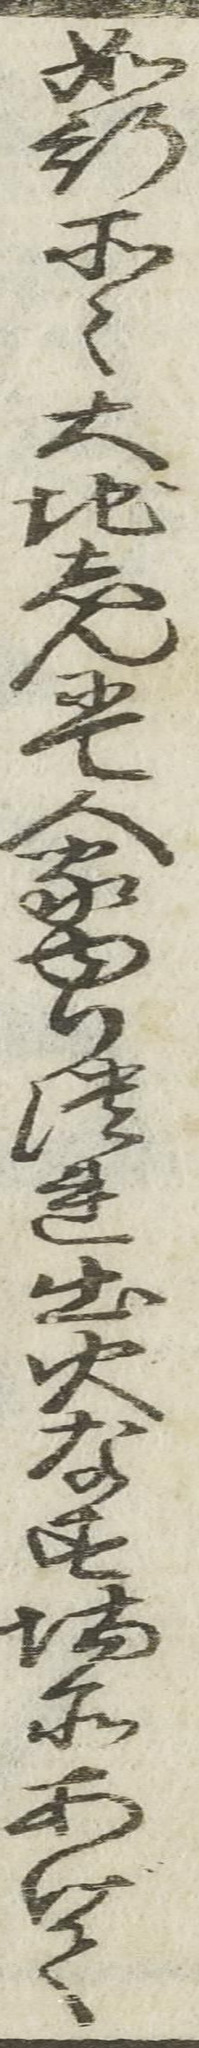如斯所〻大地しんにて人家ゆり潰れ出火なす場所あつて
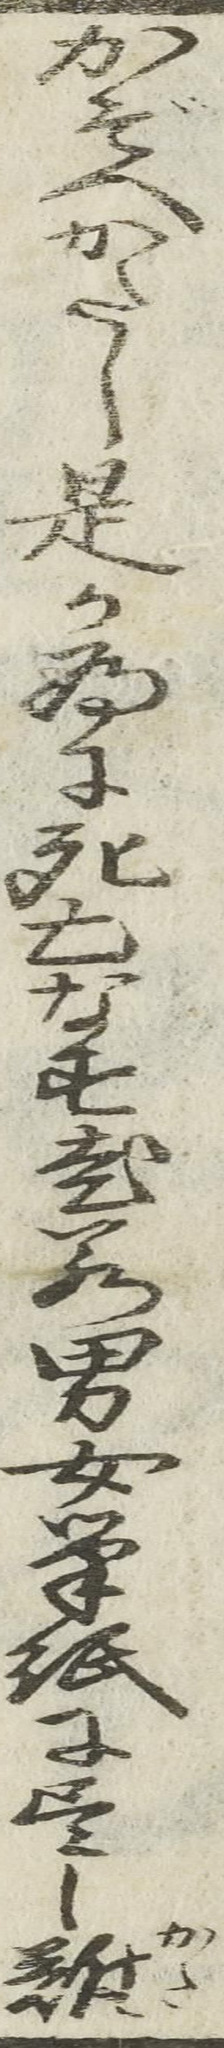かぞへかたし是か為に死亡なす老若男女単紙に望し難かた
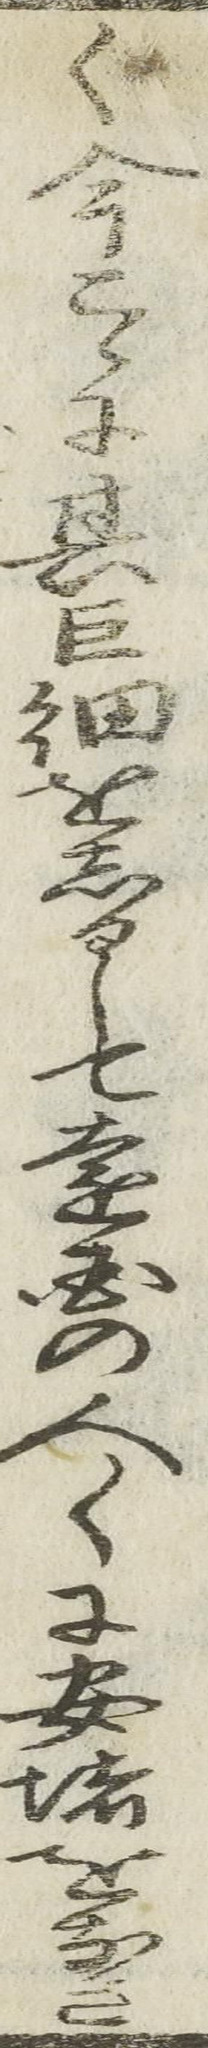く今こゝに其巨細をしるして遠国の人〳〵に安堵をなさ

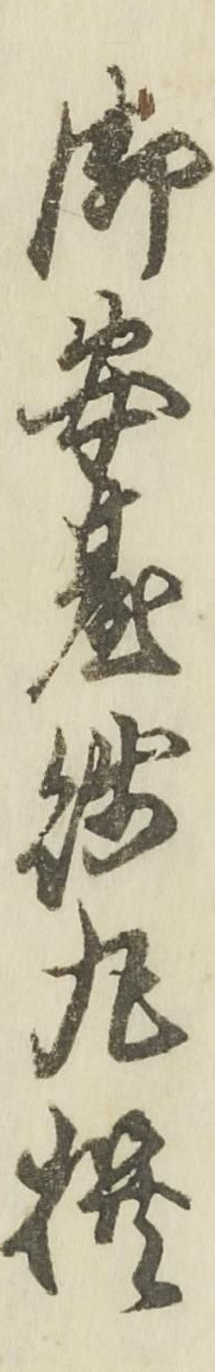御安台賤丸撰
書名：安政乙卯江戸大地震筆記　安政丙辰八月大阪大雷雨之記追加　安政三辰年七月松前辺大地震并八月大風雨記録
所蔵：東京大学地震研究所図書室 Earthquake Research Institute Library, The University of Tokyo, JAPAN
